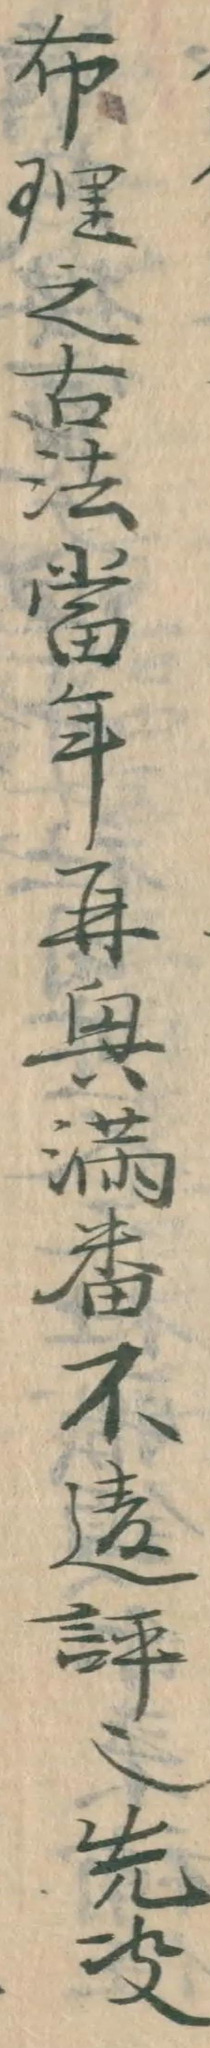布理之古法当年再興満番不違評也先決
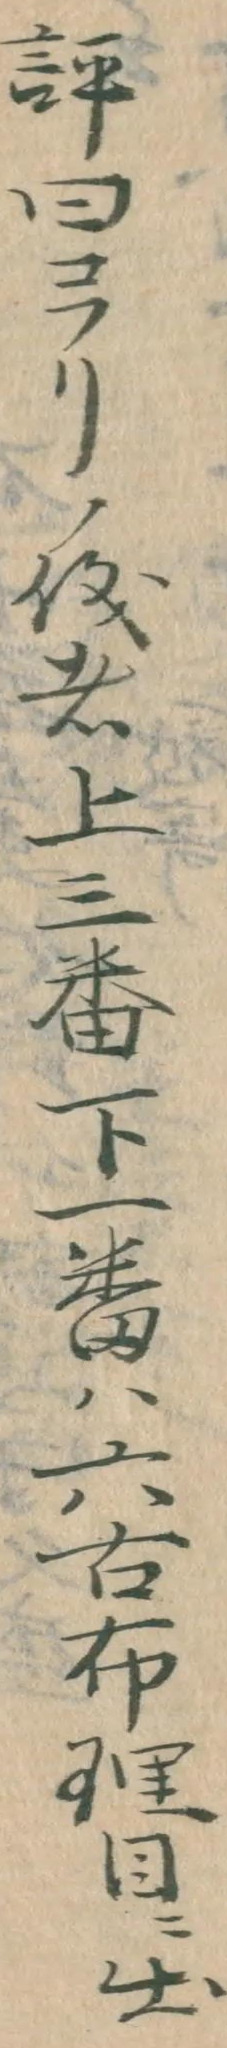評曰コフリノ儀者上三番下一番ハ六古布理目ニ出
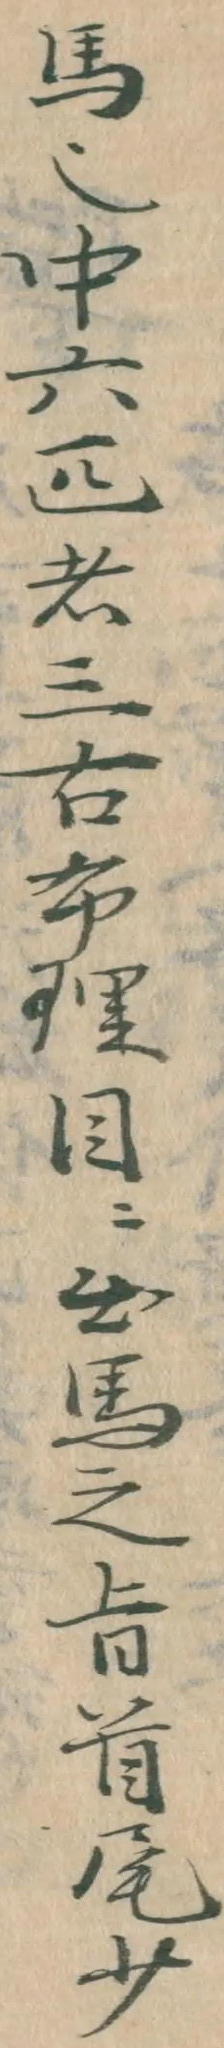馬也中六匹者三古布理目ニ出馬之旨首尾少
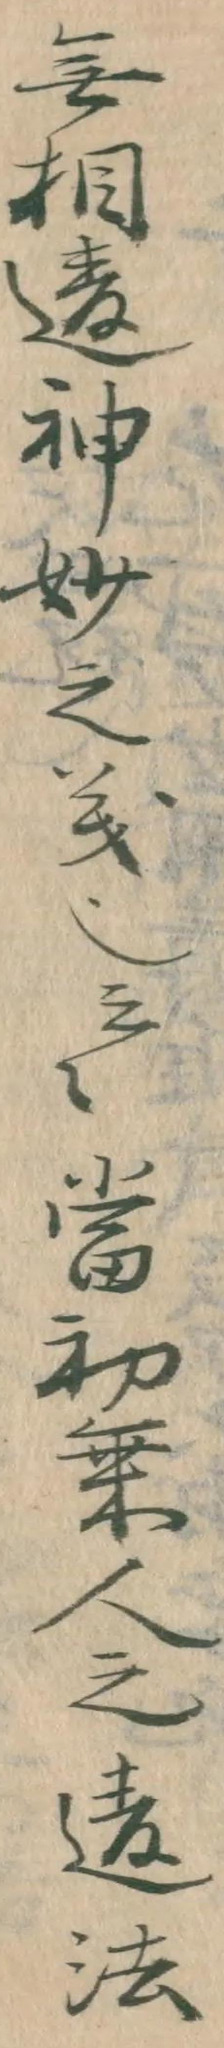無相違神妙之義也云々当初乗人之違法
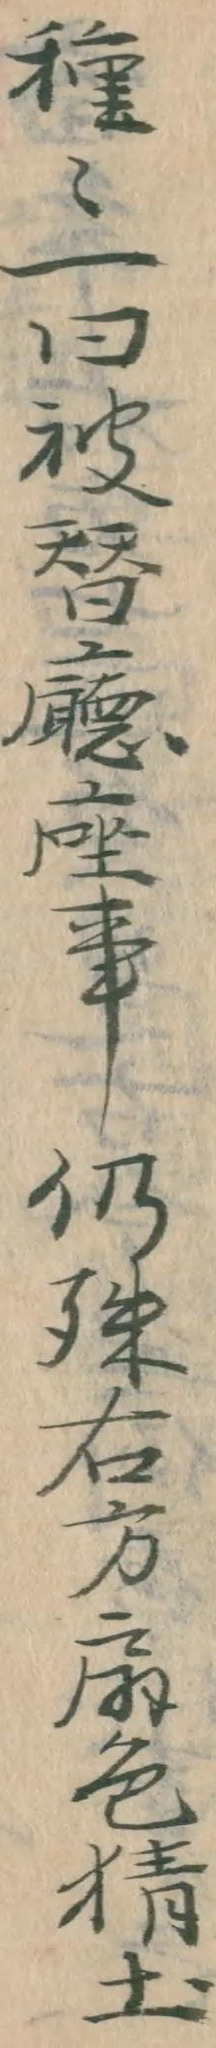種々一曰被替庁座事仍殊右方扇色精土
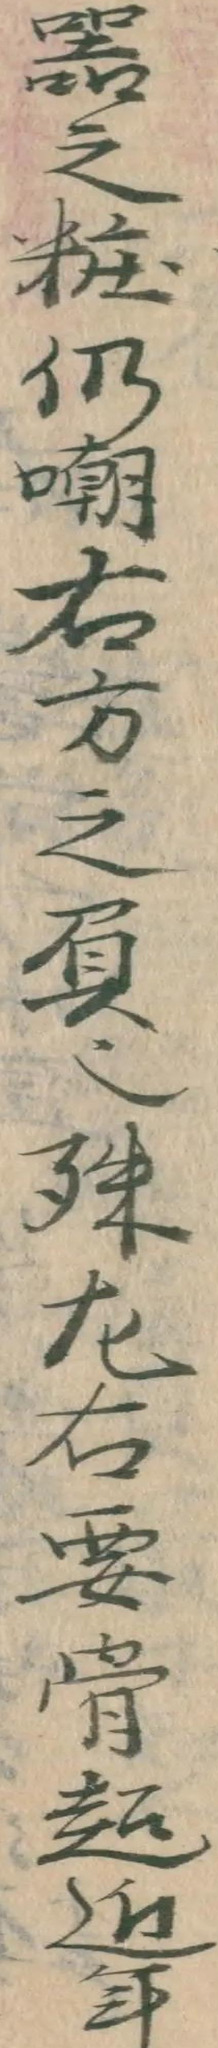器之粧仍嘲右方之負也殊左右要骨趣近年
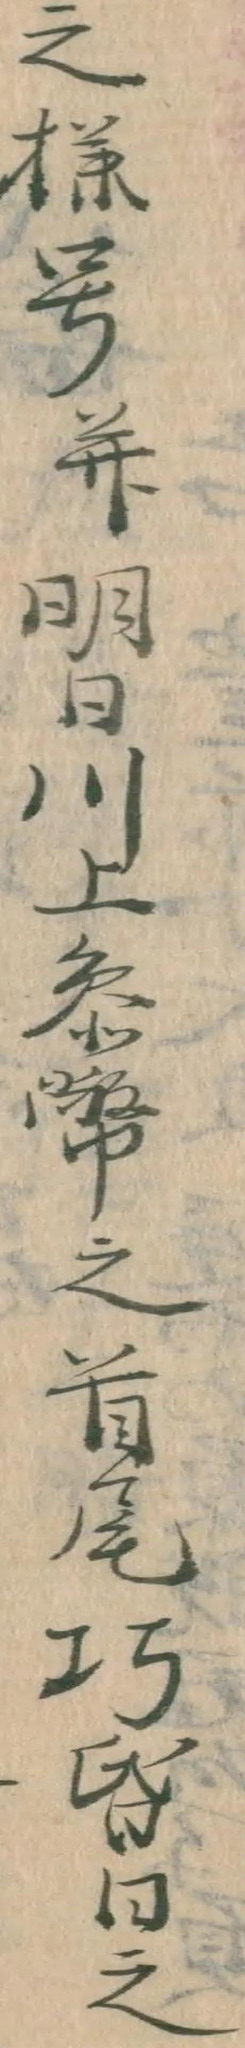之様号并明日川上参幣之首尾巧昏日之
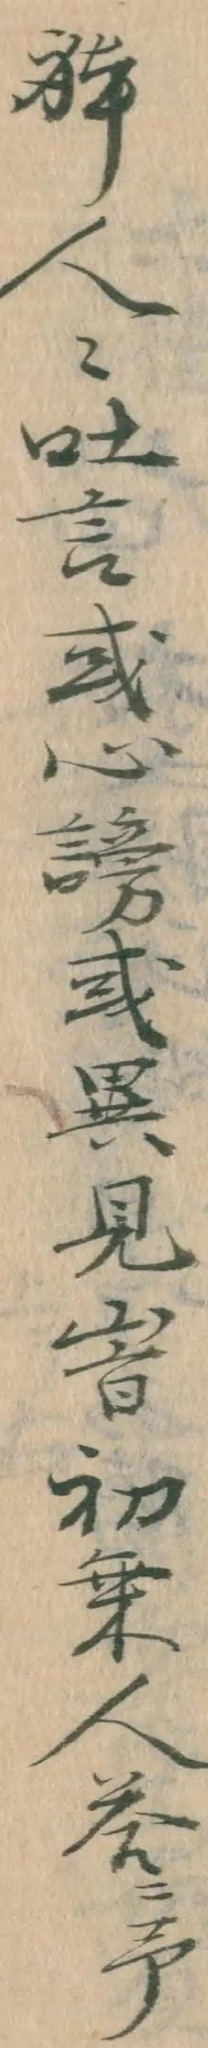体人々吐言或心謗或異見旹初乗人答ニ予
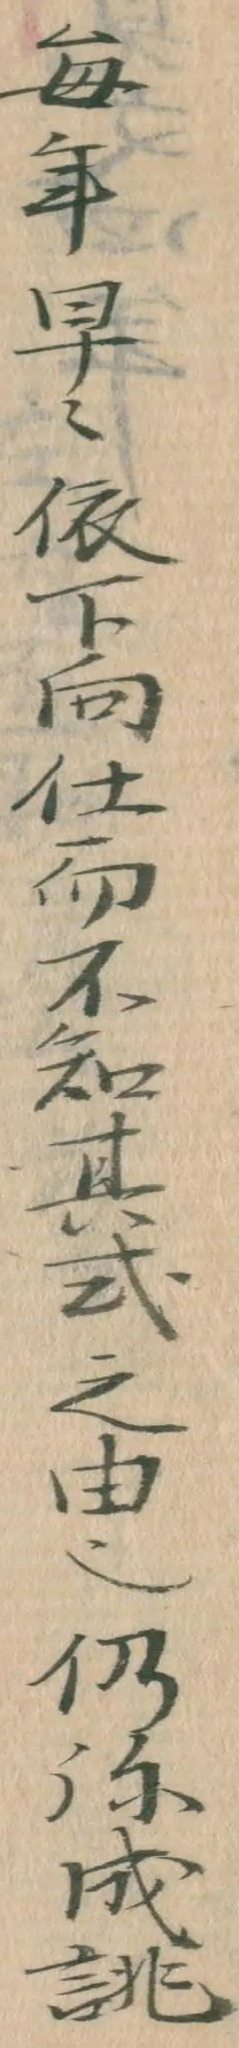毎年早々依下向仕而不知其式之由也仍弥成誂
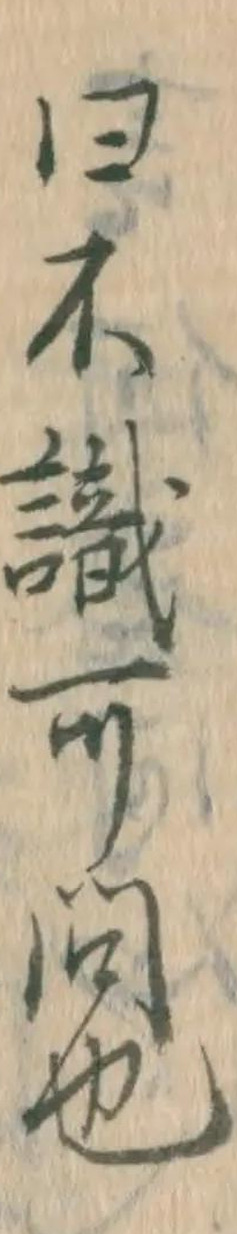曰不識可問也
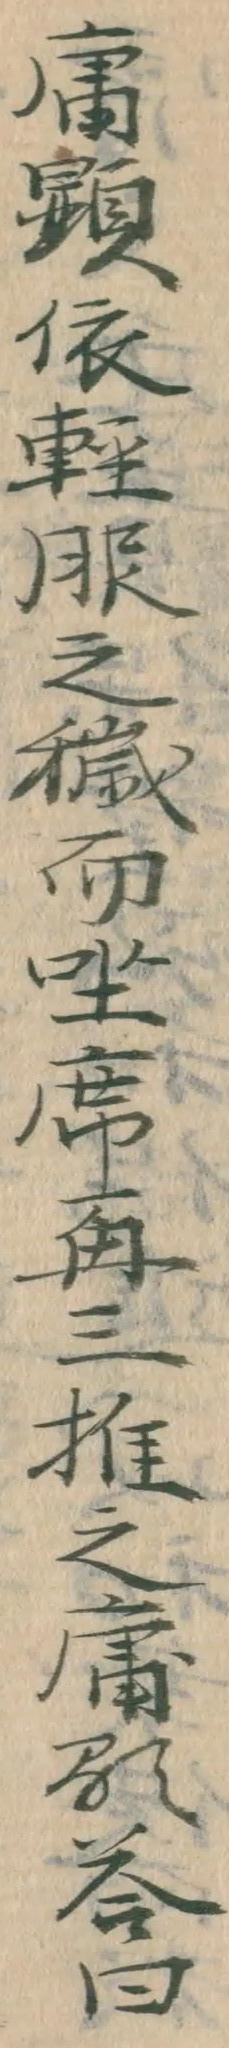庸顕依軽服之穢而坐席再三推之庸顕答曰
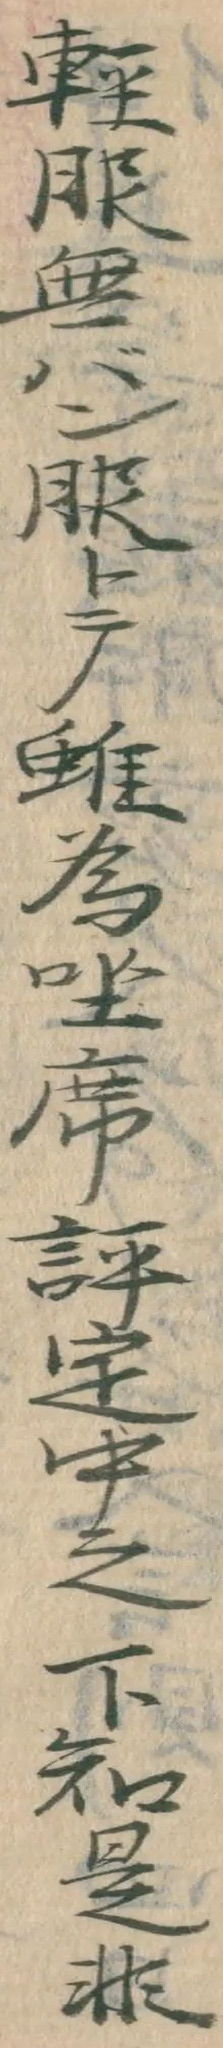軽服無バン服トテ雖為坐席評定中之下知是非
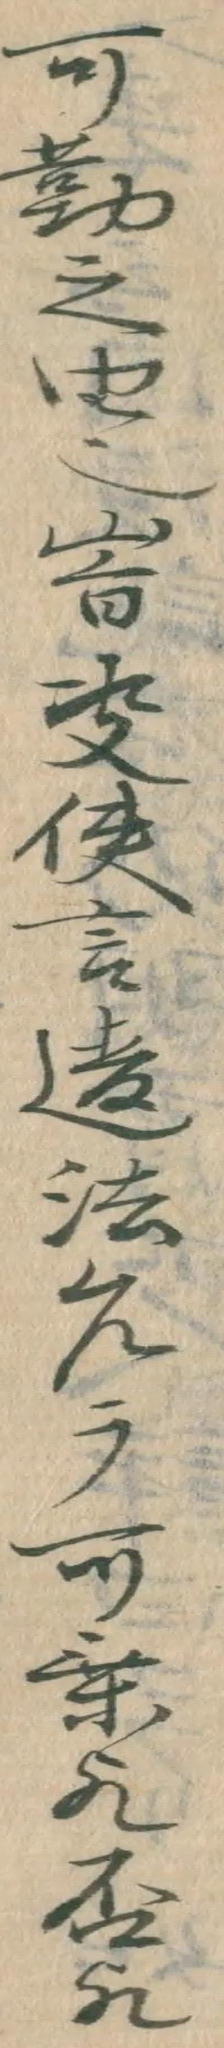可勤之由也旹決使言違法乍ラ可乗歟否歟
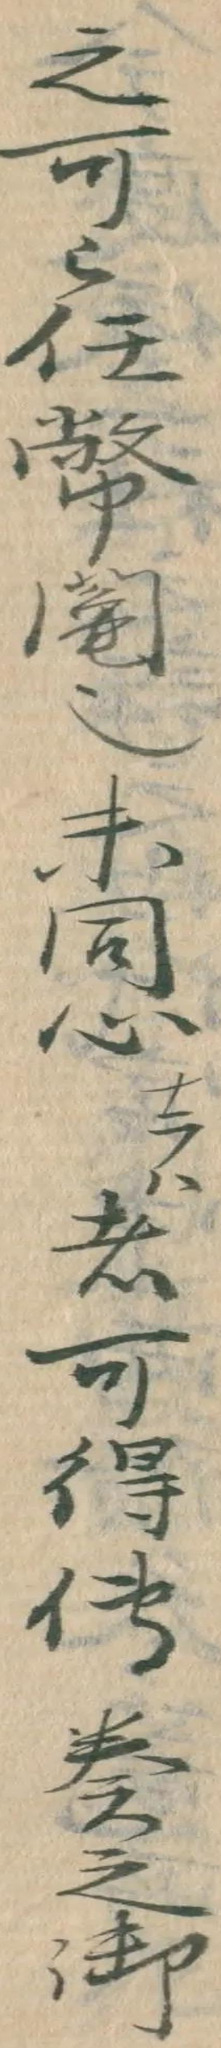之可被任幣䦰也末同心ナラハ者可得伝奏之御
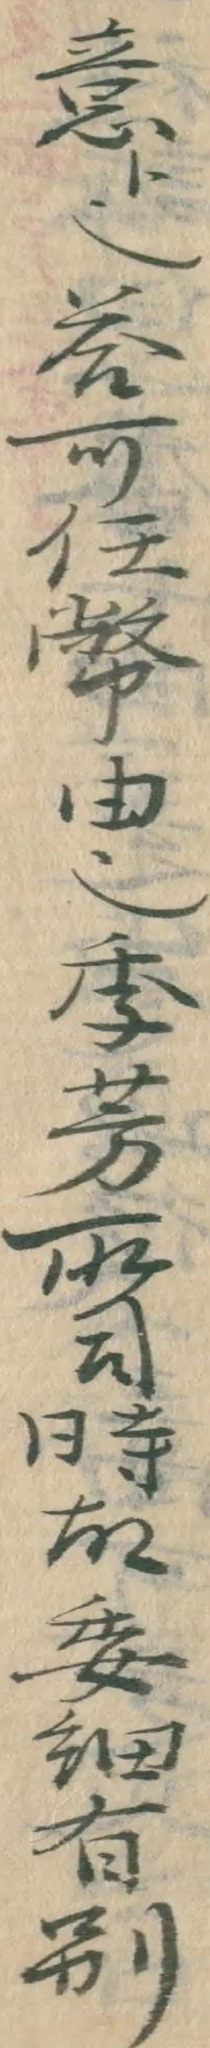意ト也答可任幣由也季芳所司時故委細有別
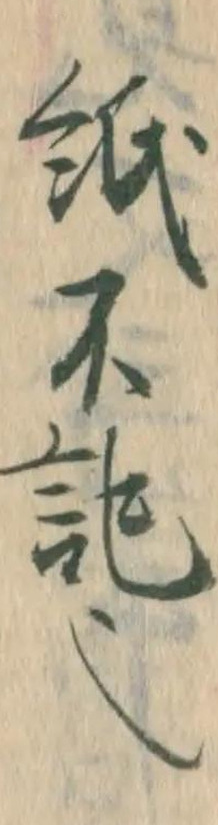紙不記也
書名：賀茂社記録. 第10冊
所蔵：国立国会図書館 National Diet Library, JAPAN
